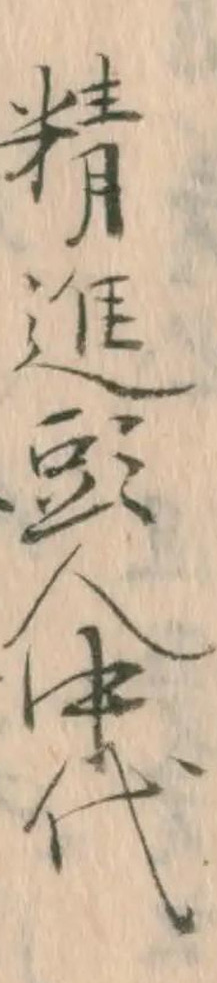精進頭人中代
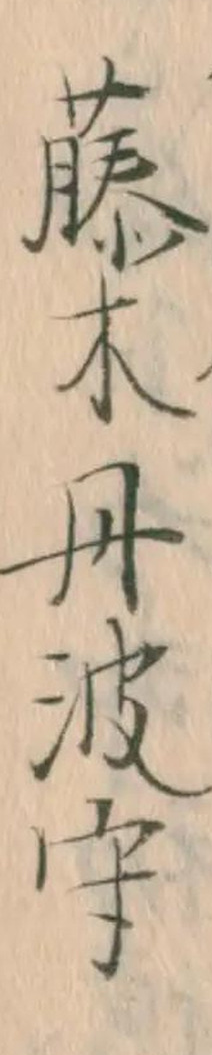藤木丹波守
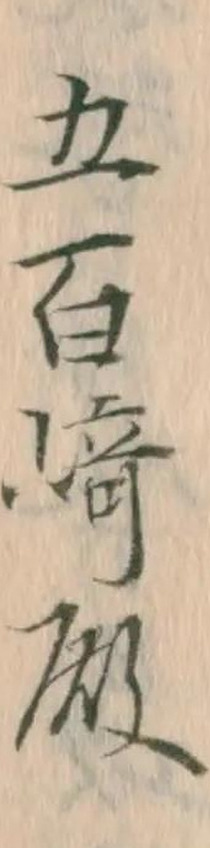五百崎殿
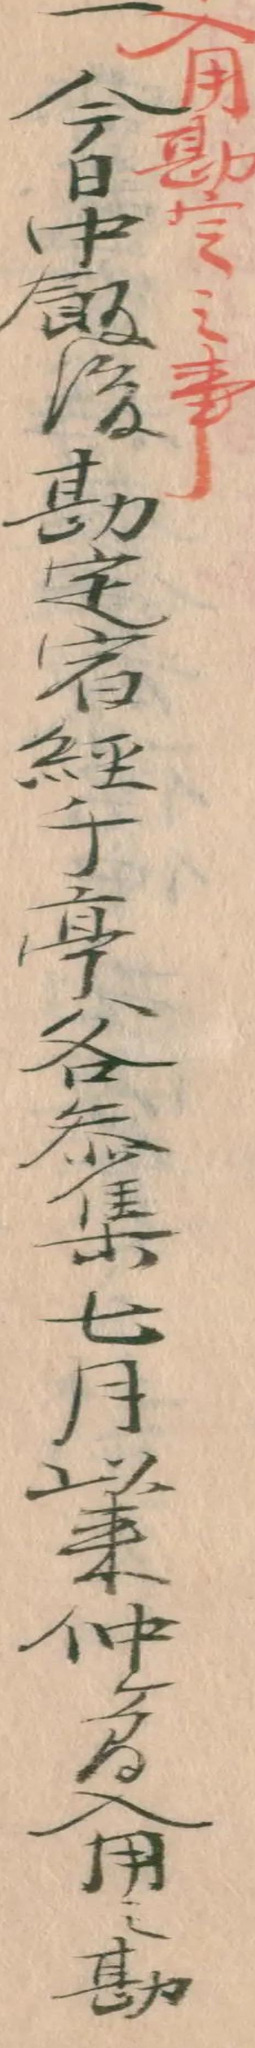一今日中飯後勘定宿経千亭ヘ各参集七月以来仲ヶ間入用之勘
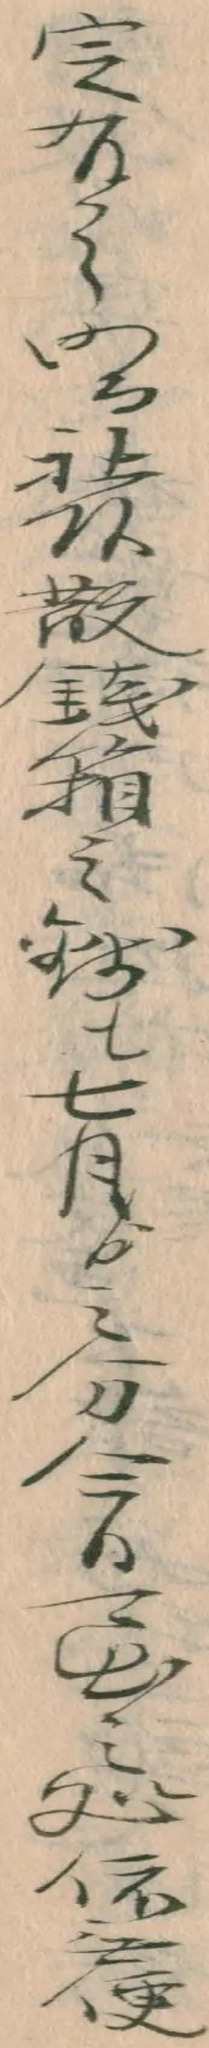定有之仍而社頭散銭箱之銭も七月ゟ之分今日可出之処依無便
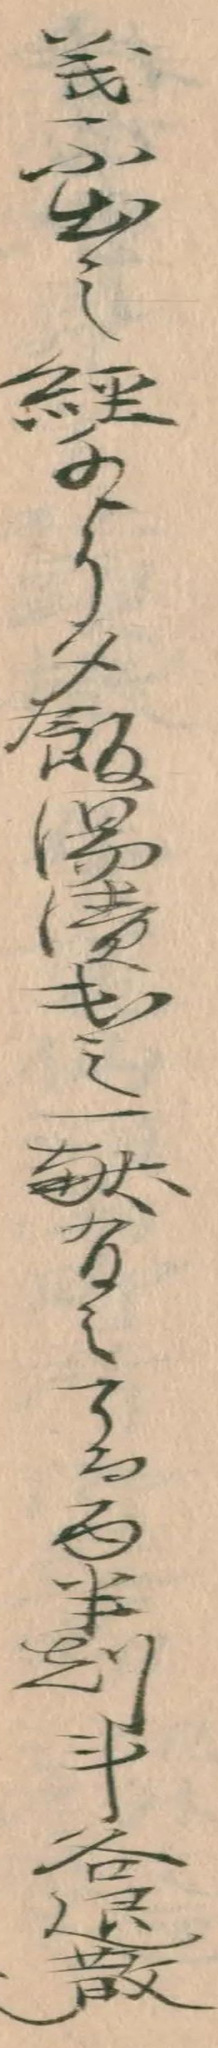義不出也経千より夕飯湯漬出之一献有之了而酉半刻斗各退散也
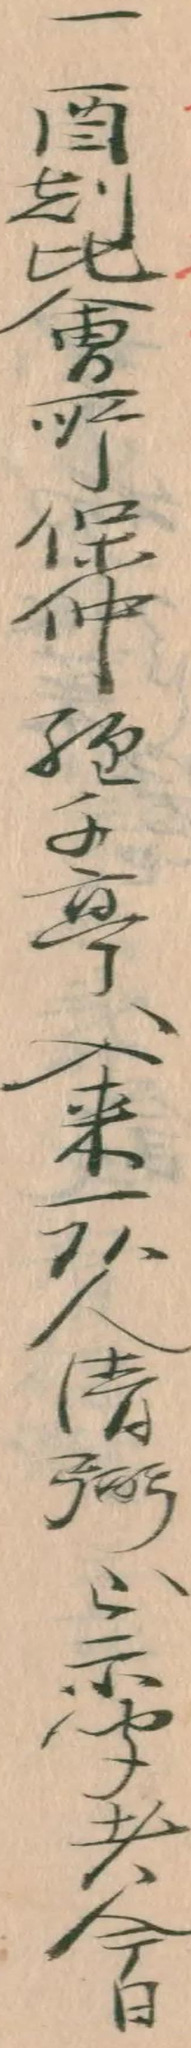一酉刻比會所保仲経千亭へ入来一頭人清弼被示聞者今日
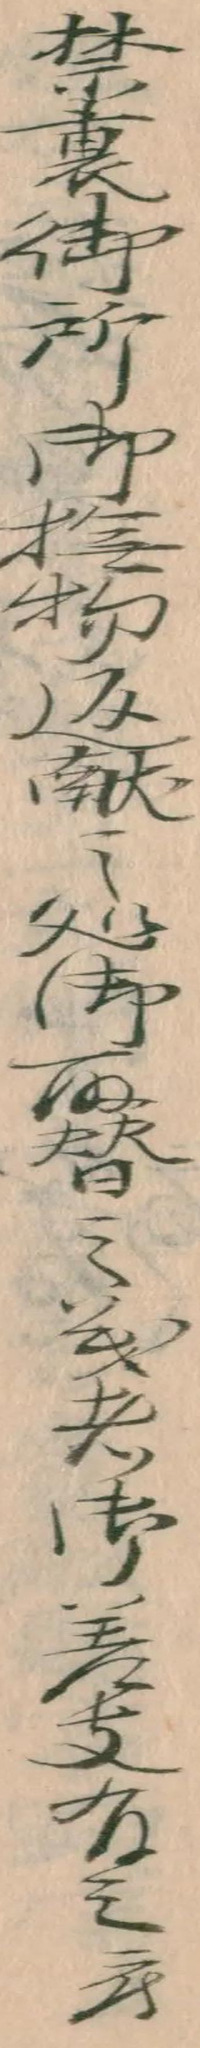禁裏御所御撫物返献之処御取替之義者御差支有之ニ付
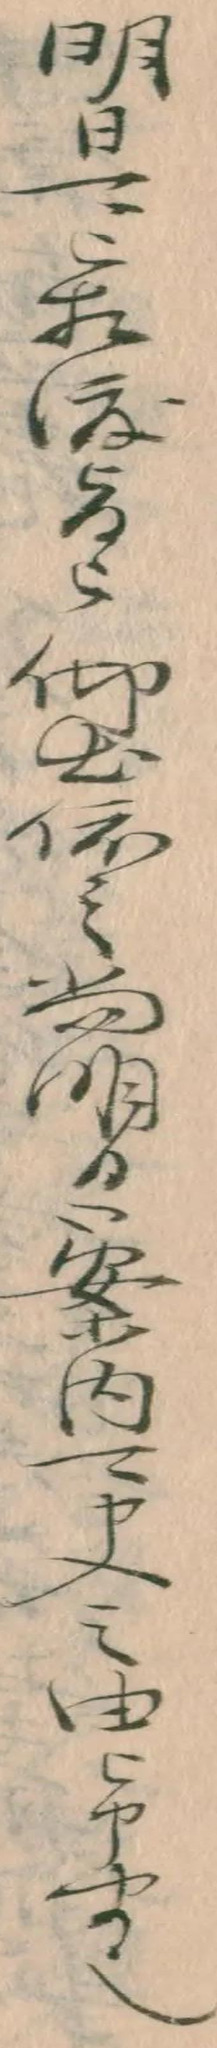明日可被相渡旨被仰出依之尚明日御案内可申入之由被申聞也
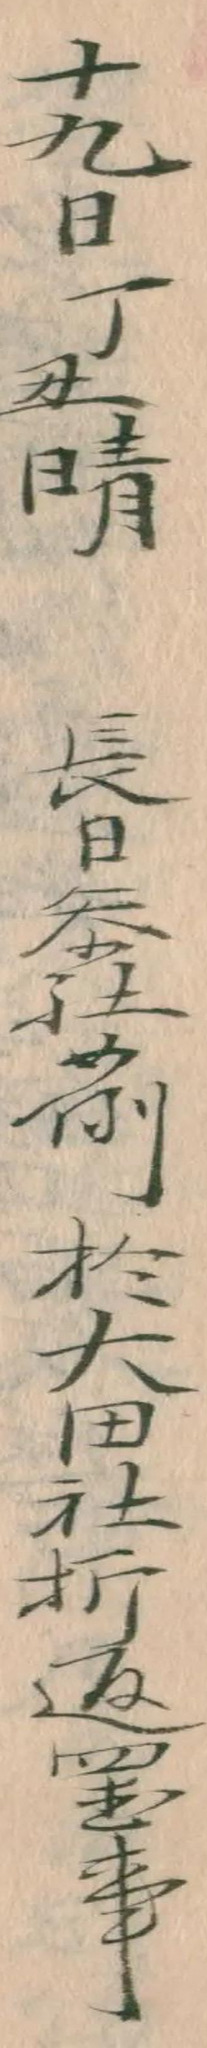十九日丁丑晴長日参社如例於大田社折返置事
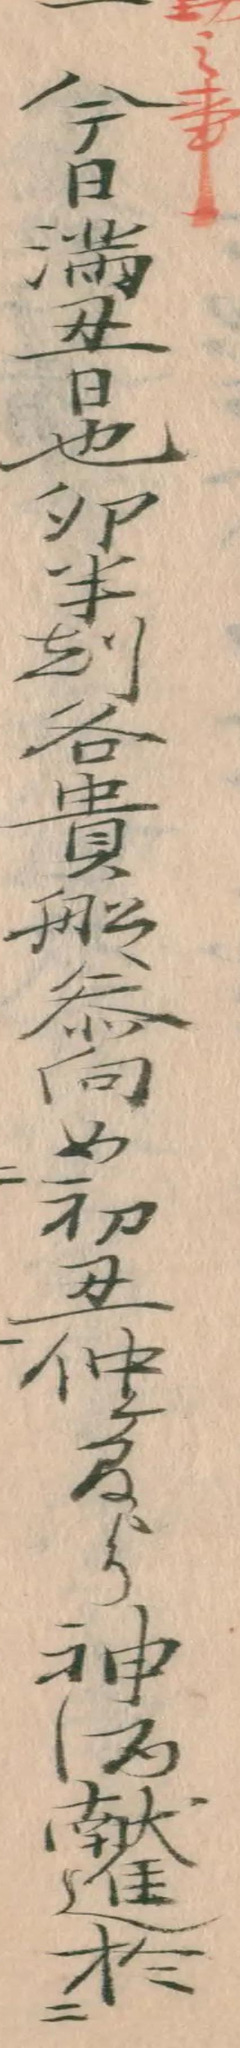一今日満丑日也卯半刻各貴舩へ参向如初丑仲ヶ間より神酒献進於
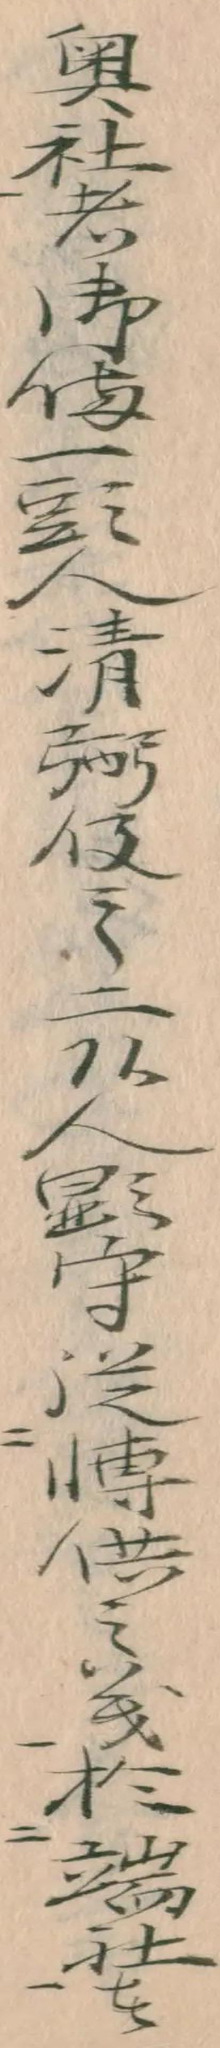奥社者御備一頭人清弼役之二頭人顕守従轉供之義於瑞社は
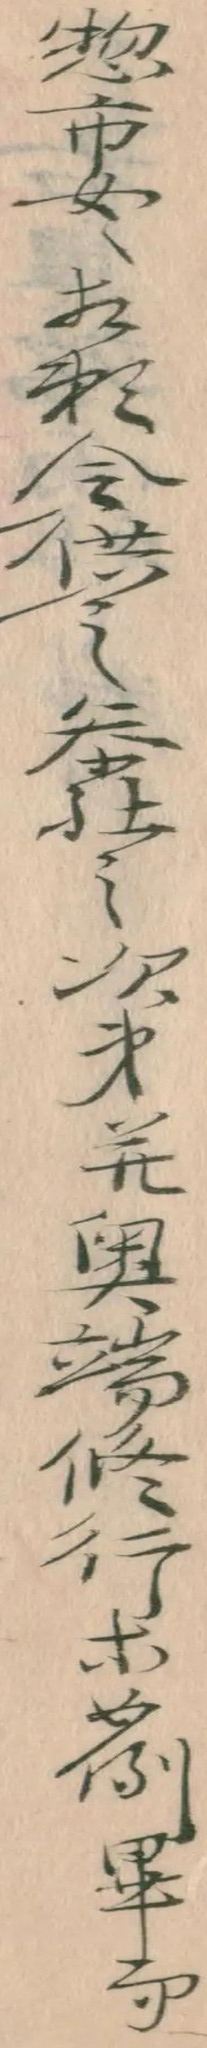惣市女へ相頼令供之参社之次第并奥端修行等如例畢而
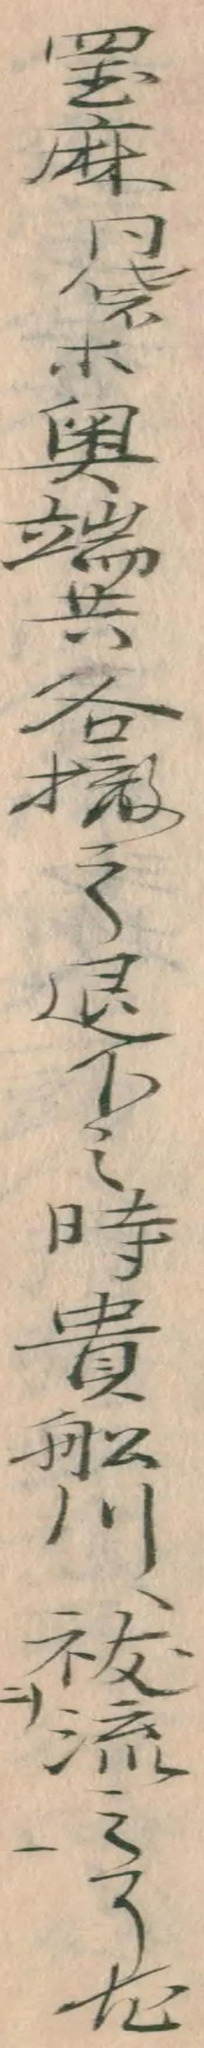置麻同袋等奥端共各撤之退下之時貴舩川へ祓流之了尤
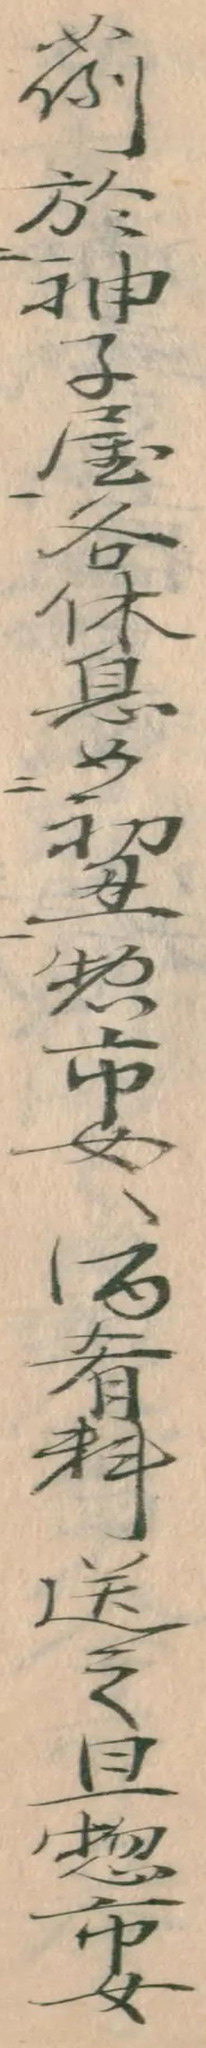如例於神子屋各休息如初丑惣市女へ酒肴料送之且惣市女
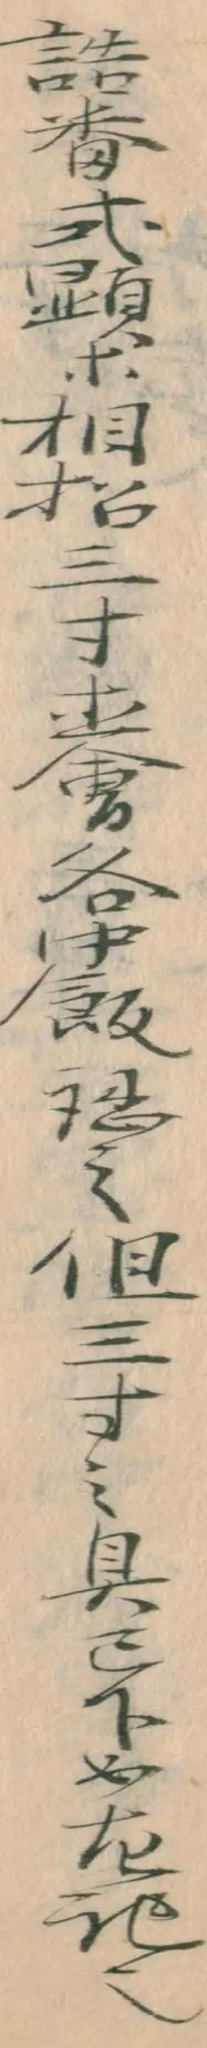語番式顕等相招三寸直會各中飯認之但三寸之具已下如左記也
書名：賀茂社記録. 第74冊
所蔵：国立国会図書館 National Diet Library, JAPAN
